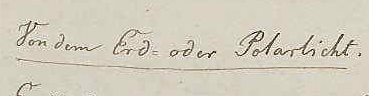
Von dem Erd- oder Polarlicht.
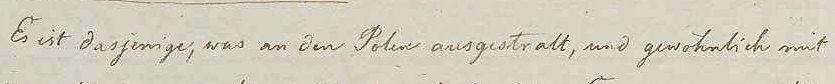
Es ist dasjenige, was an den Polen ausgestralt, und gewöhnlich mit
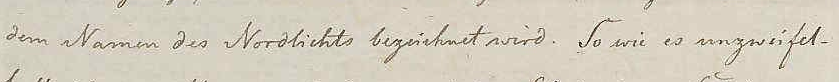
dem Namen des Nordlichts bezeichnet wird. So wie es unzweifel-
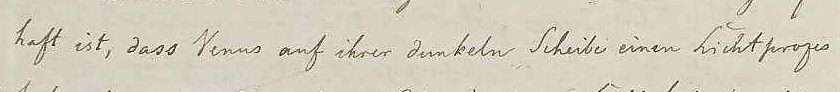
haft ist, dass Venus auf ihrer dunkeln Scheibe einen Lichtprozes
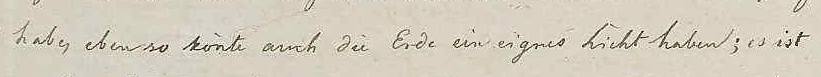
habe, eben so könte auch die Erde ein eignes Licht haben; es ist
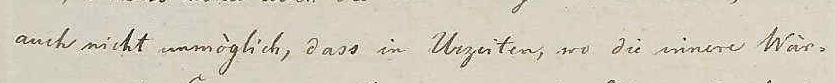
auch nicht unmöglich, dass in Urzeiten, wo die innere Wär-
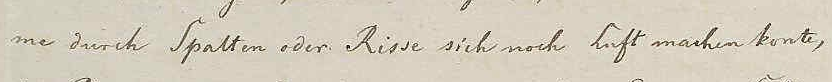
me durch Spalten oder Risse sich noch Luft mache konte,
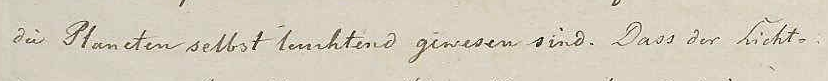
die Planeten selbst leuchtend gewesen sind. Dass der Licht-
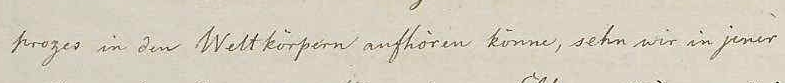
prozes in den Weltkörper aufhören könne, sehn wir in jener
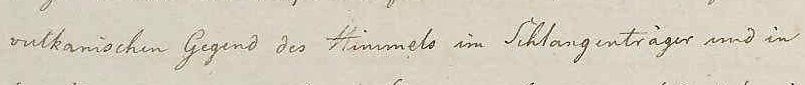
vulkanischen Gegend des Himmels im Schlangenträger und in
